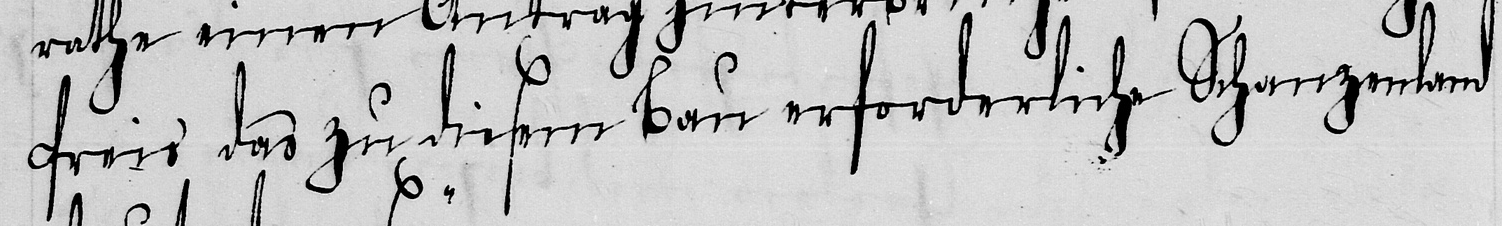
Preis das zu diesem Bau erforderliche Schanzenland
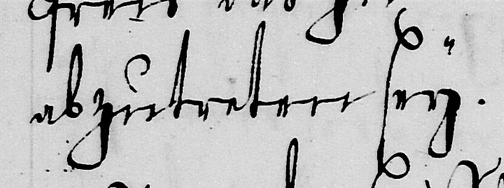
abzutreten sey.
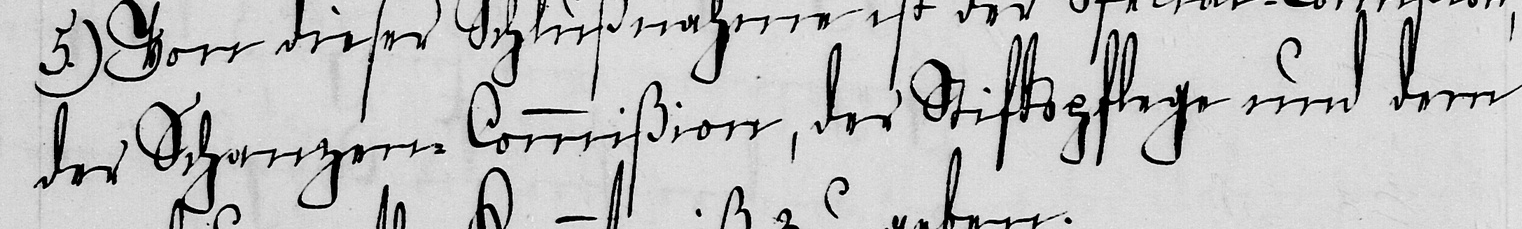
der Schanzen-Commißion, der Stiftspflege und dem
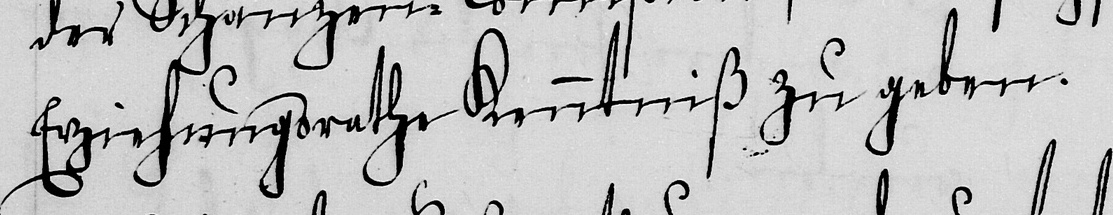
Erziehungsrathe Kenntniß zu geben.
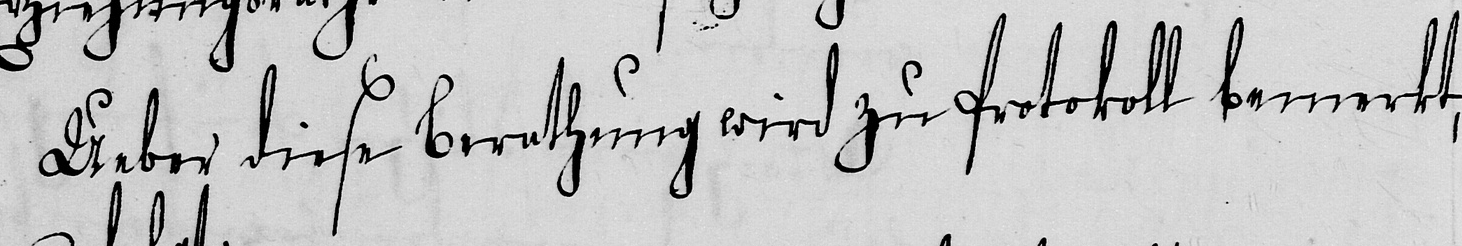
Ueber diese Berathung wird zu Protokoll bemerkt,
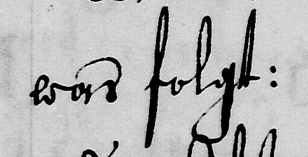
was folgt:
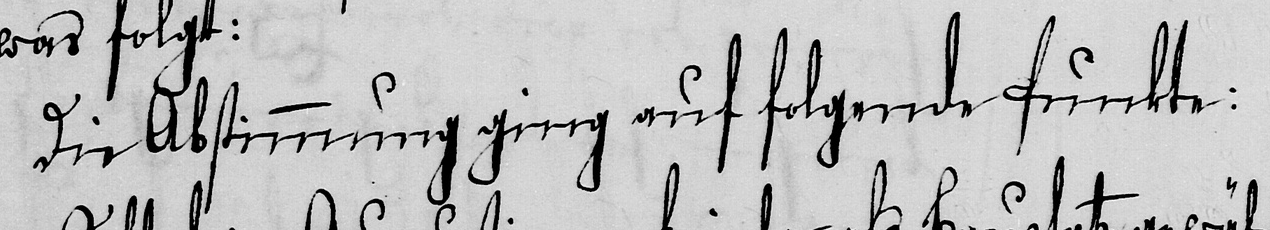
Die Abstimmung ging auf folgende Punkte:
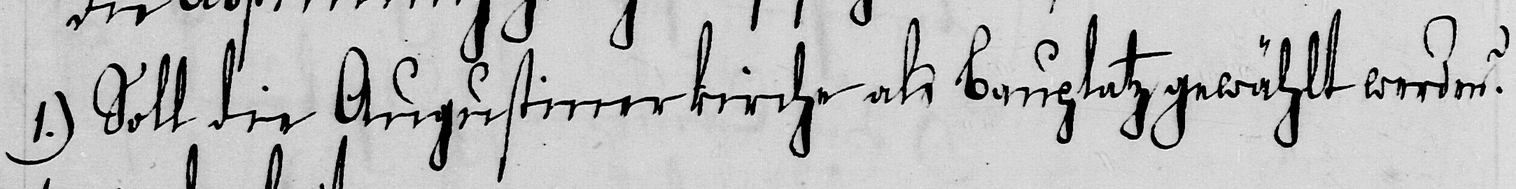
1.) Soll die Augustinerkirche als Bauplatz gewählt werden?
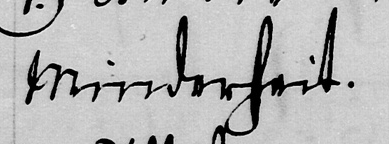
Minderheit.
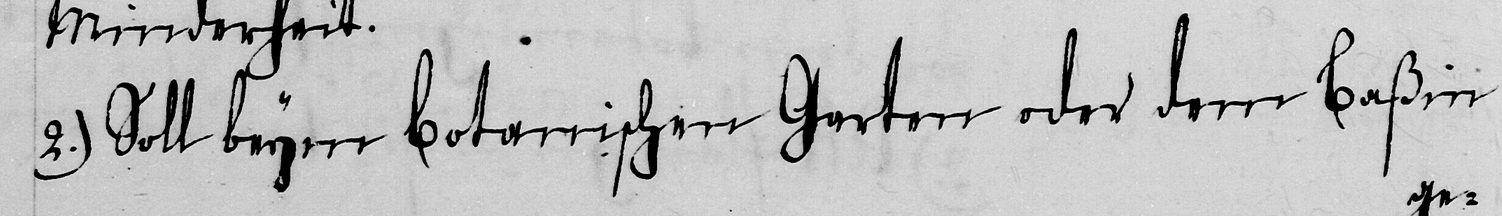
2.) Soll beym botanischen Garten oder dem Baßin
